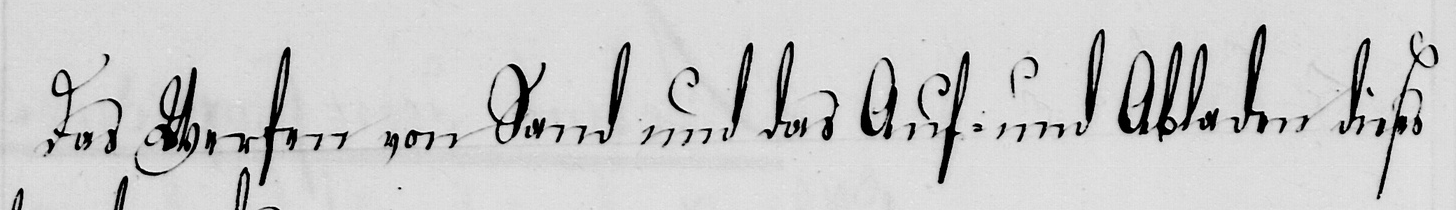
Das Werfen von Sand und das Auf- und Abladen die¬
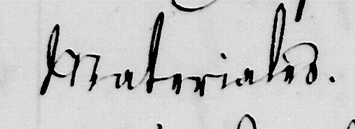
Materiales.
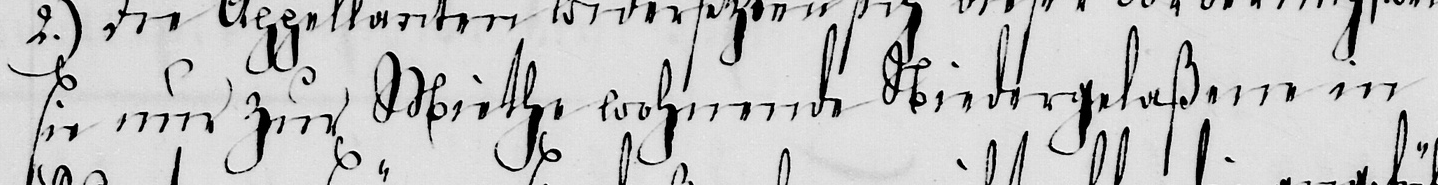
sie nur zur Miethe wohnende Niedergelaßene in
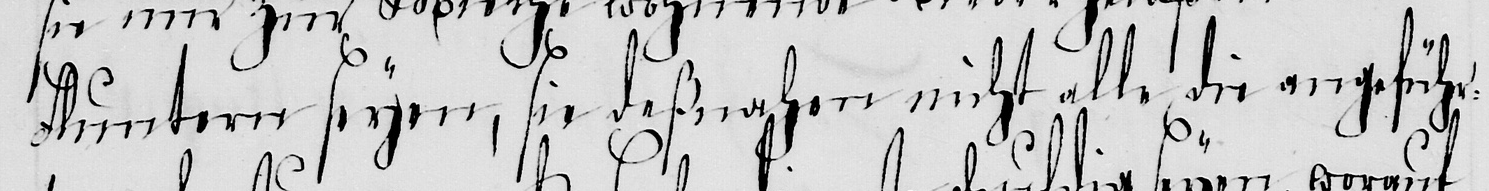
Fluntern seyen, sie deßnahen nicht alle die angefüh¬
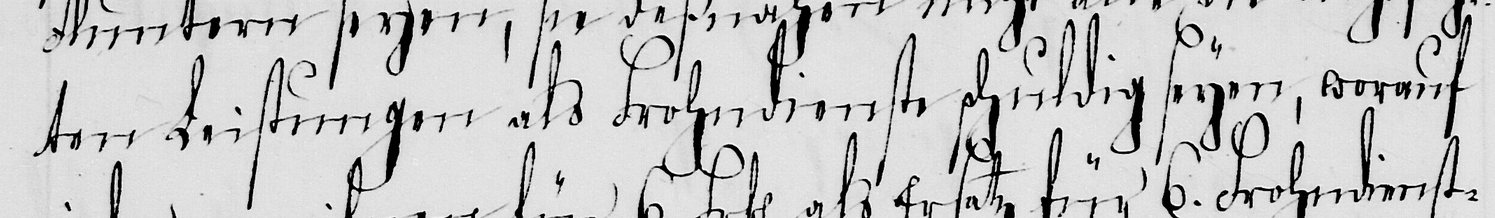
rten Leistungen als Frohndienste schuldig seyen, worauf
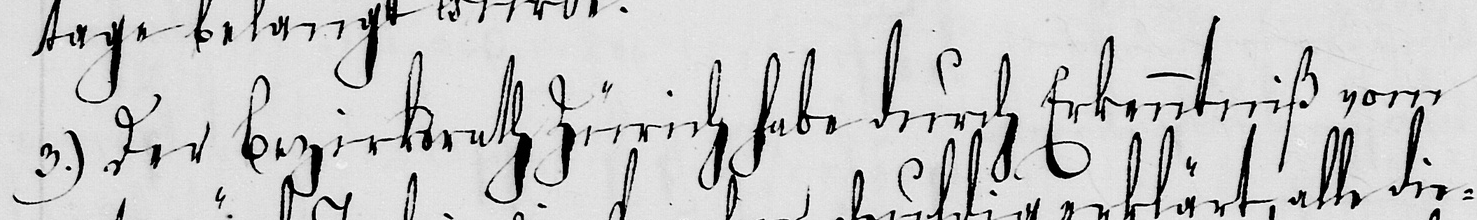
3.) Der Bezirksrath Zürich habe durch Erkenntniß vom
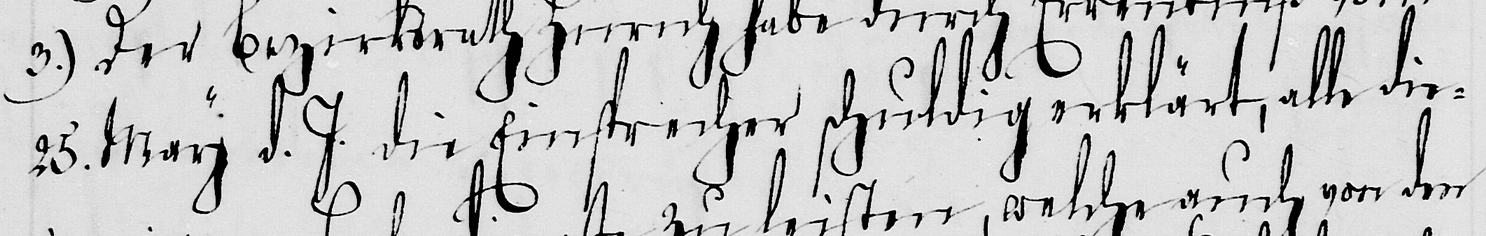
25. May d. J. die Einsprecher schuldig erklärt, alle di¬
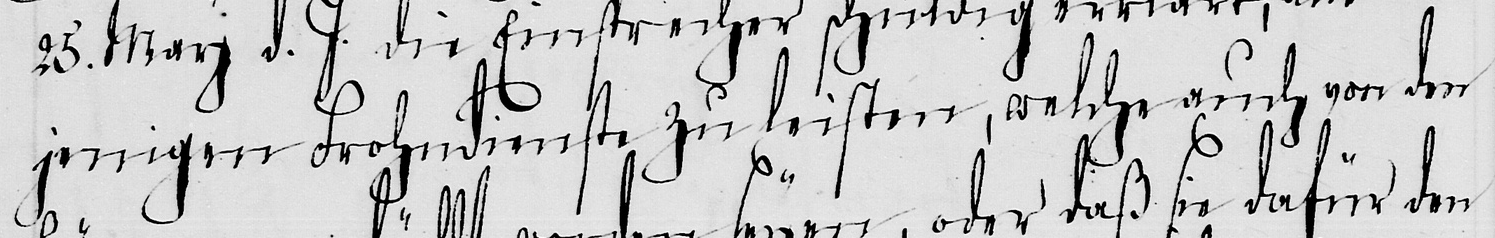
ejenigen Frohndienste zu leisten, welche auch von den
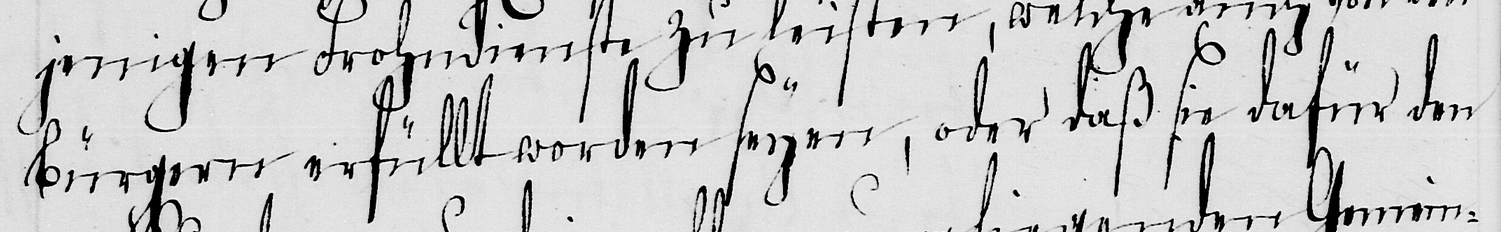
Bürgern erfüllt worden seyen, oder daß sie dafür den
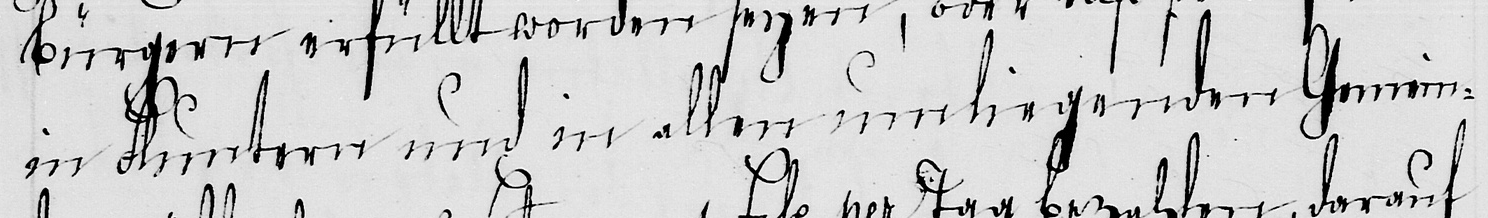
in Fluntern und in allen umliegenden Gemein¬
